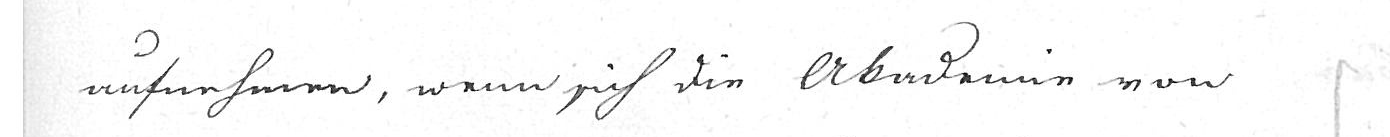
aufnehmen, wenn sich die Akademie von
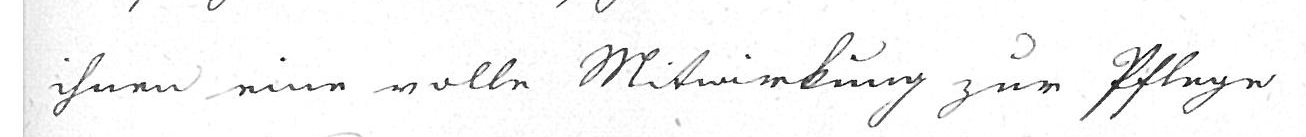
ihnen eine volle Mitwirkung zur Pflege
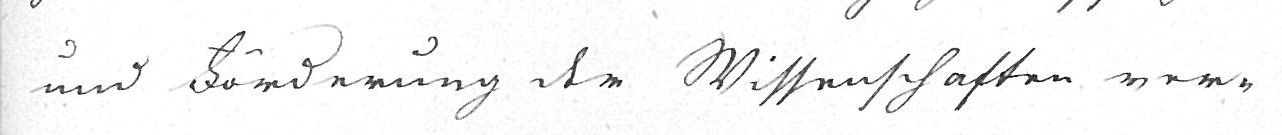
und Förderung der Wissenschaften ver-
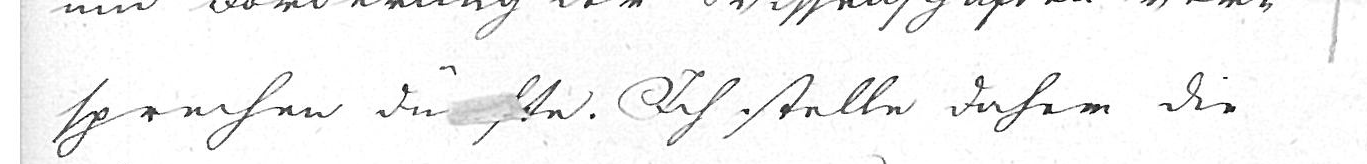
sprechen dürfte. Ich stelle daher die
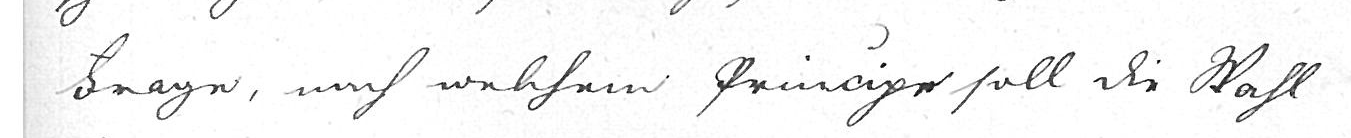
Frage, nach welchem Principe soll die Wahl
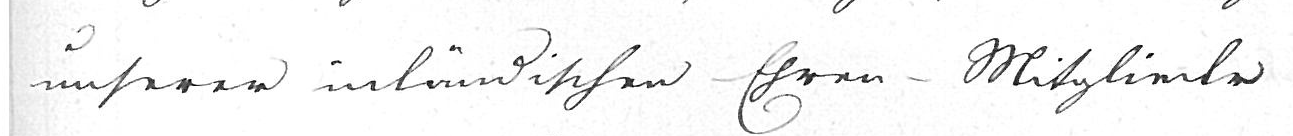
aunderer inländischen Ehren-Mitglieder
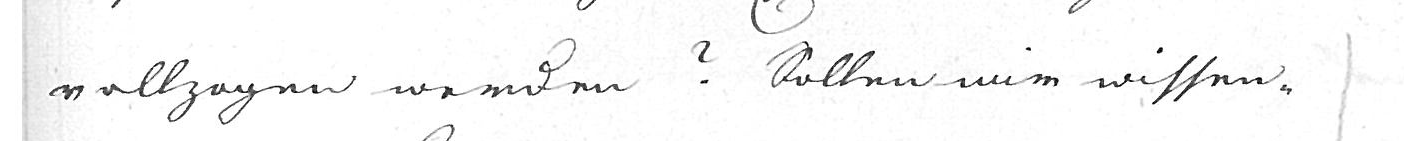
vollzogen werden? Sollen wir wissen-
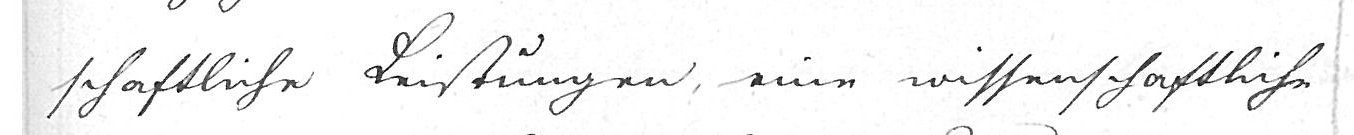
schaftliche Leistungen, eine wissenschaftliche
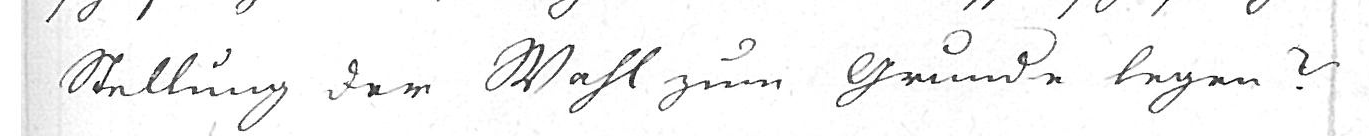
Stellung der Wahl zum Grunde legen?
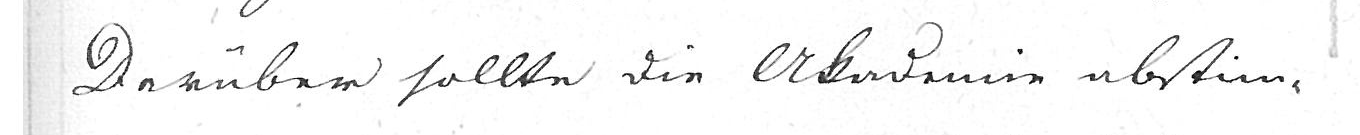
Darüber sollte die Akademie abstim-
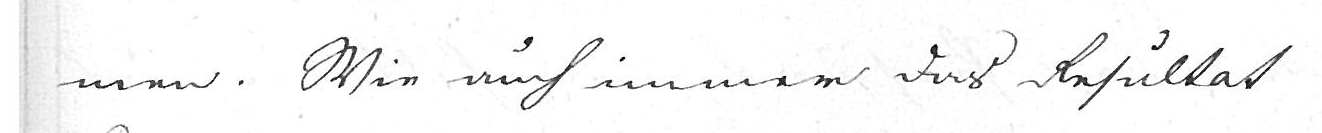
men. Wie auch immer das Resultat
